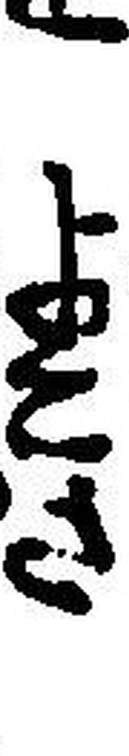よこさ
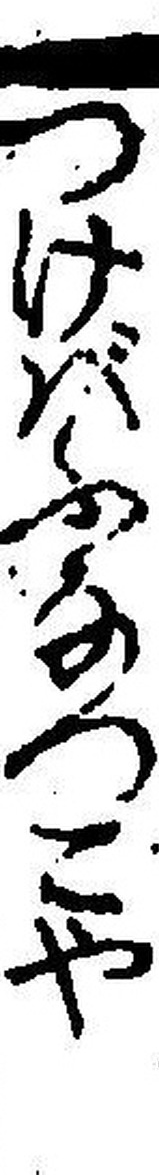つけばふなつこや
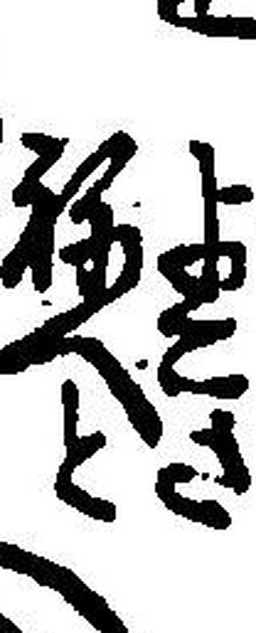ねへと
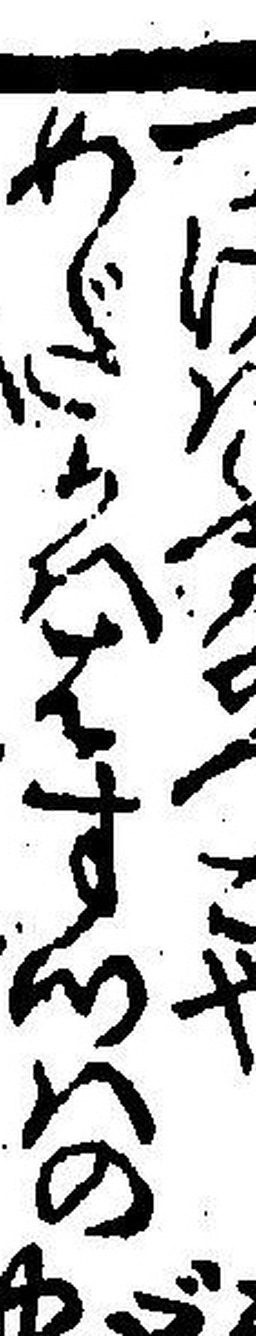めだかははすつはの
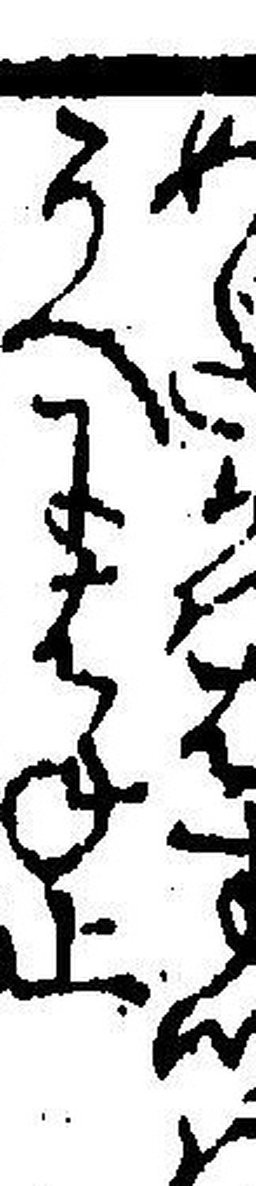うへにはね上
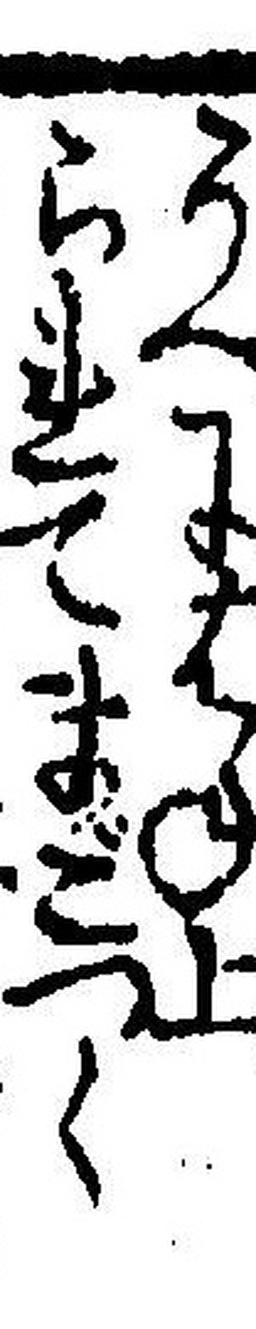られてまごつく
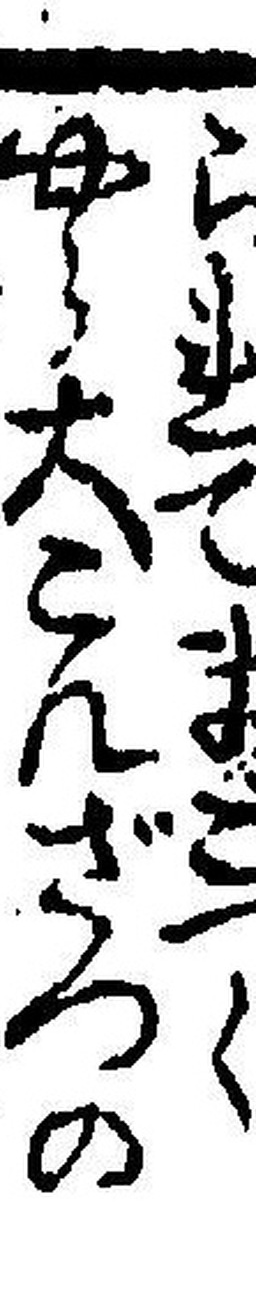やら大こんざつの
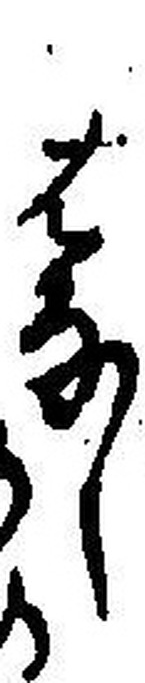はなし
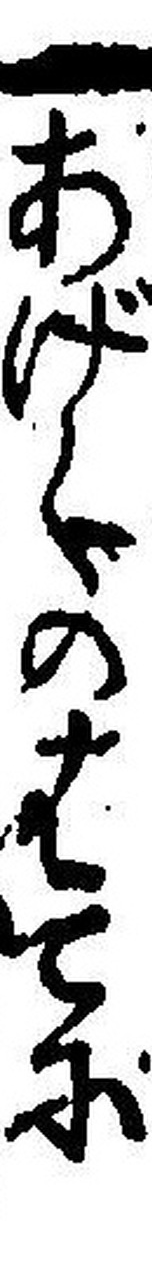あげくのはてに
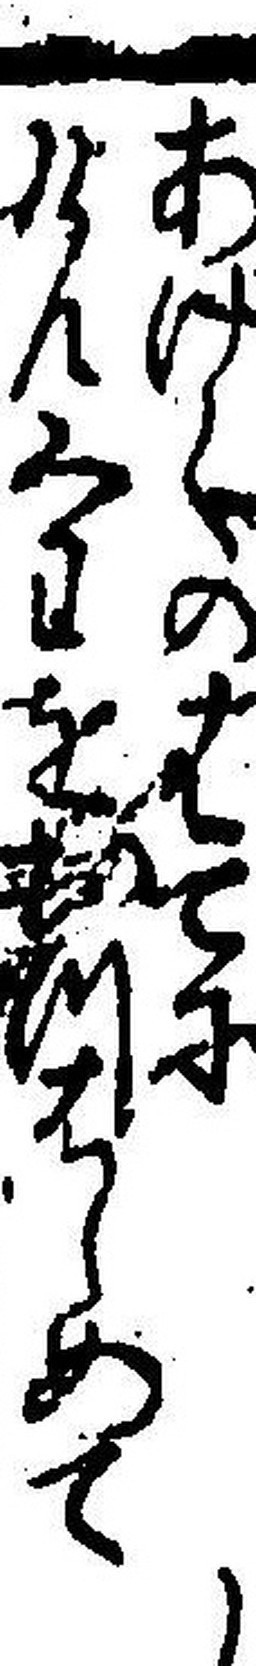けんくわをおつはしめて
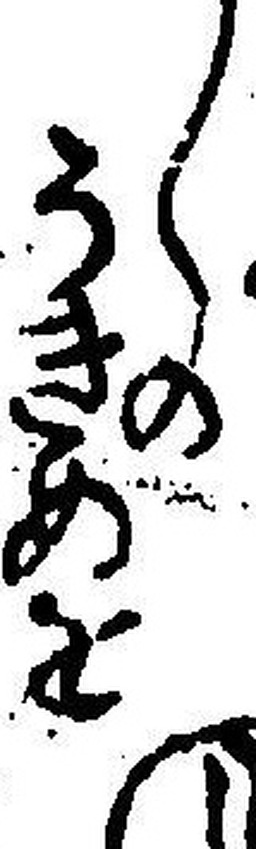うきめを
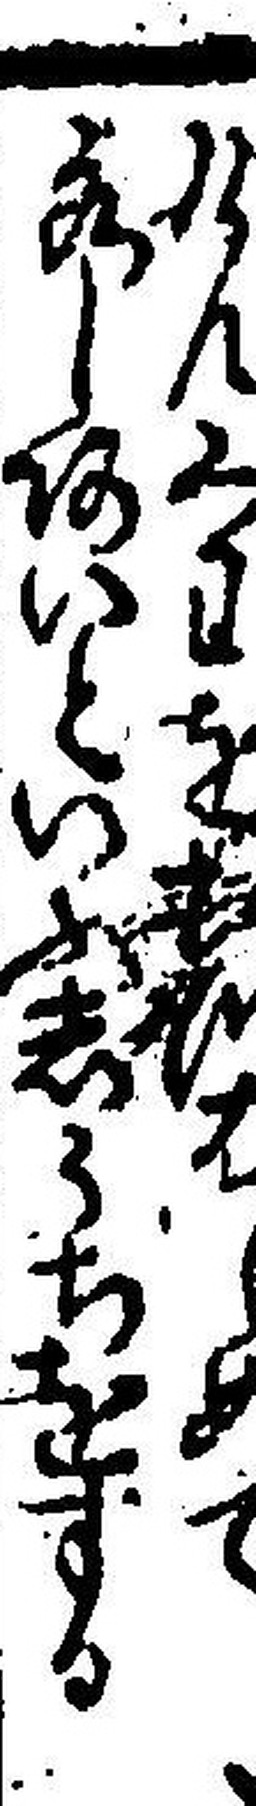水しあいといふしうちをする
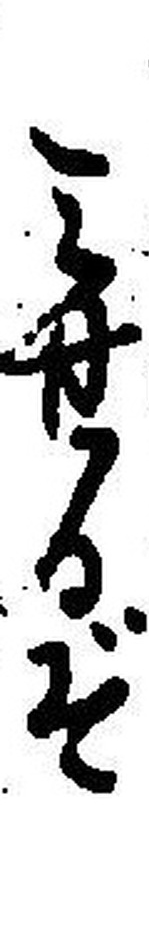みせるぞ
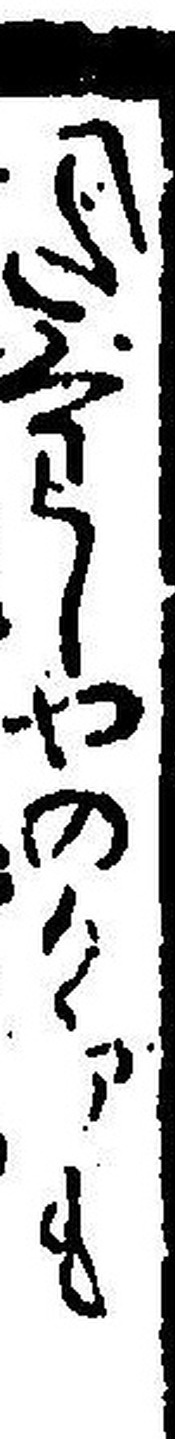〽だくわしやのかゝァも
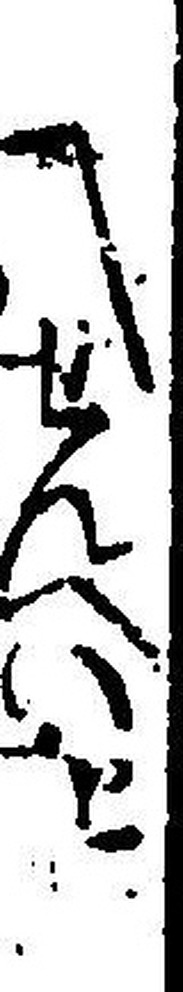〽せんへいを
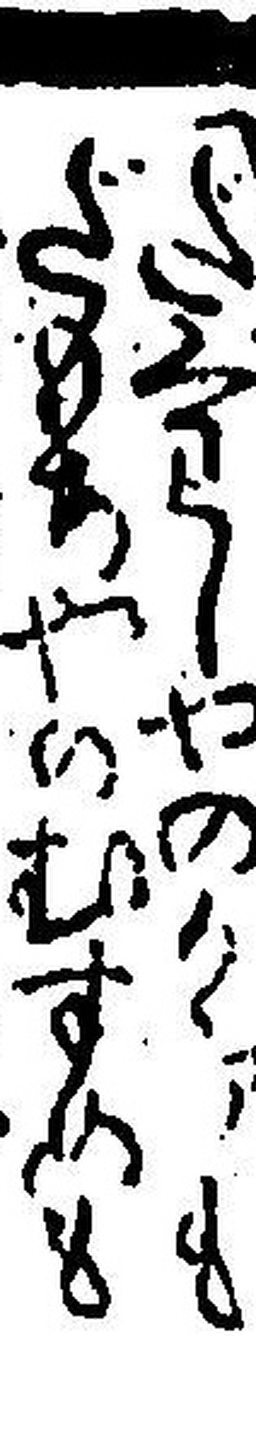だもちやのむすめも
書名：徳若水縁起金性 / 樹下石上作
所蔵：東京大学総合図書館 General Library in the University of Tokyo, JAPAN
